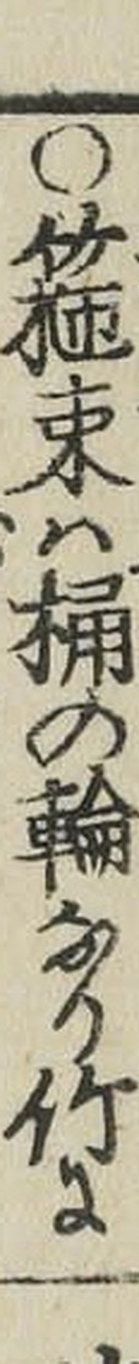○箍束は桶の輪なり竹に
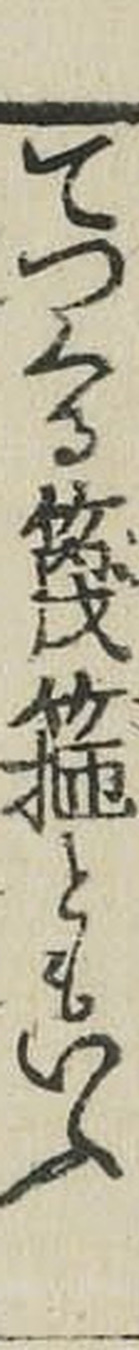てつくる篾箍ともいふ
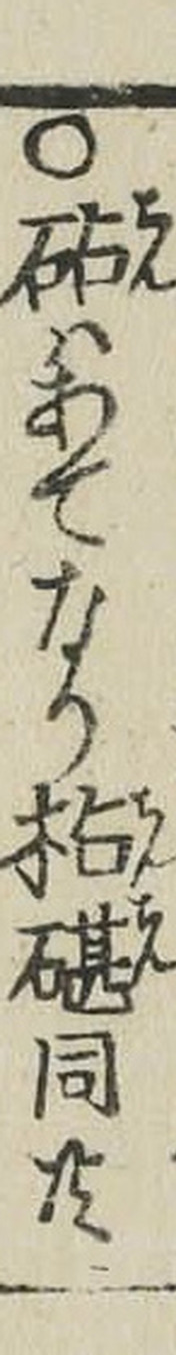○砧はあてなり枮碪同共
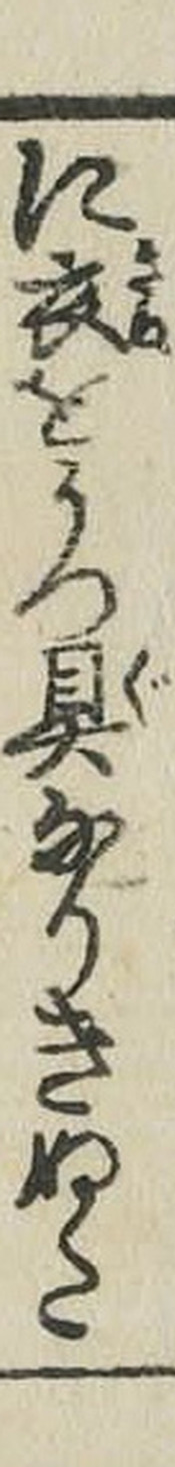に衣をうつ具なりきぬたと
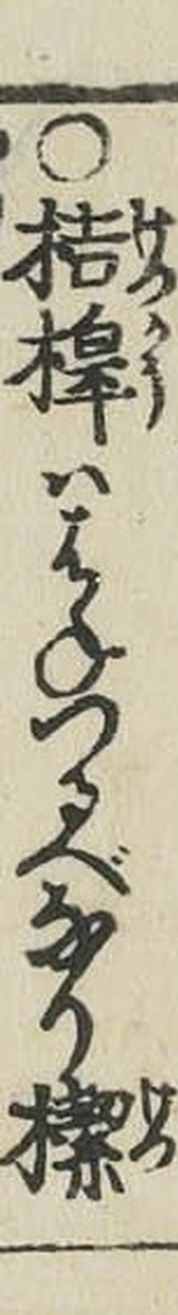○桔槹ははねつるべなり𣚃
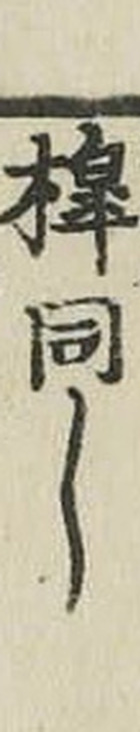槹同し
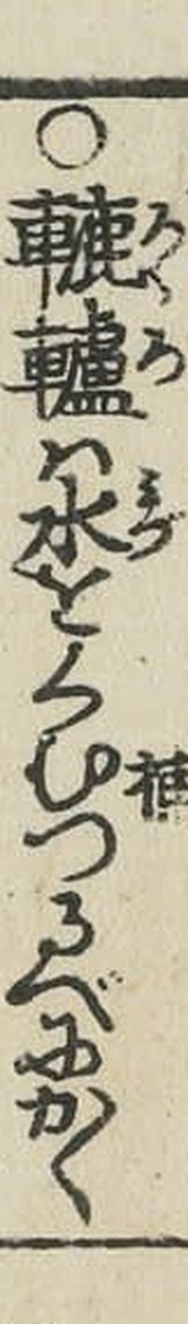○轆轤は水をくむつるべにかゝ
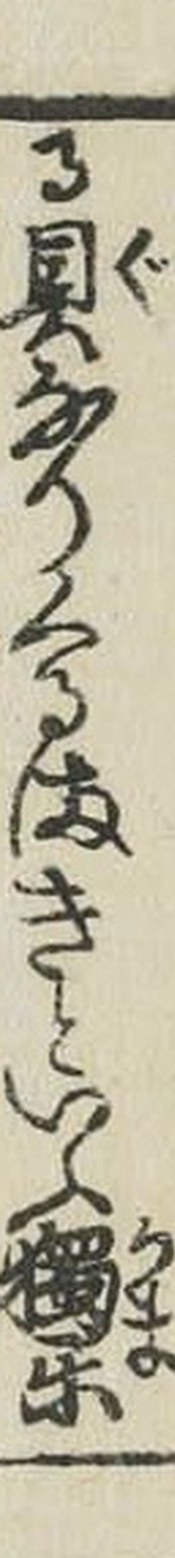る具なりくるまきといふ独楽
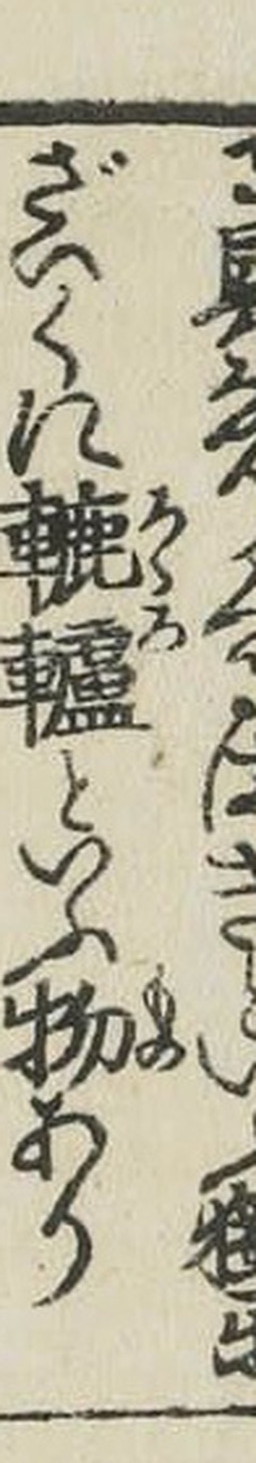ざいくに轆轤といふ物あり
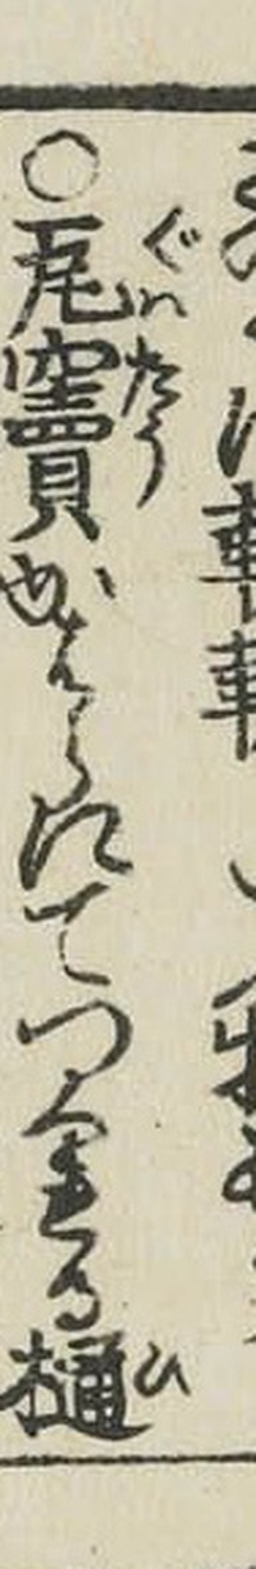○瓦竇かはらにてつくれる樋
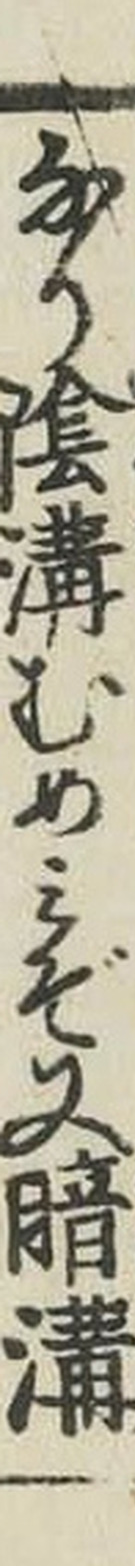なり陰溝むめみぞ又暗溝
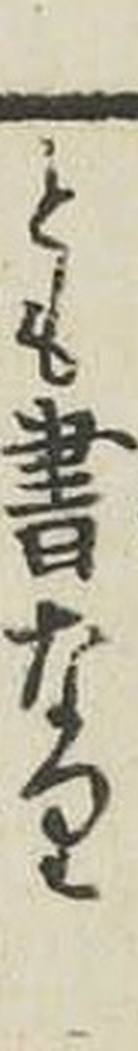とも書なり
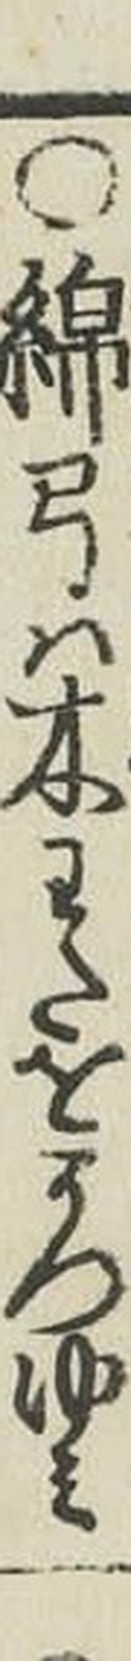○綿弓は木わたをうつゆみ
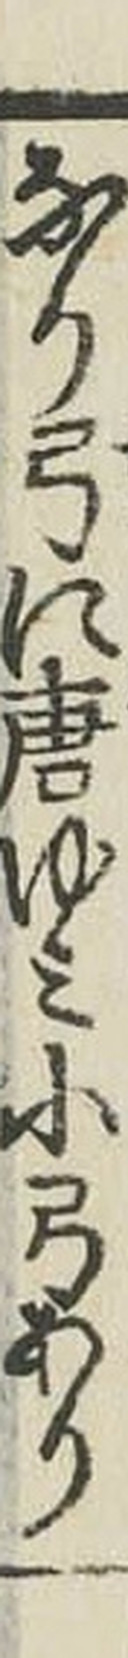なり弓に唐ゆみ小弓あり
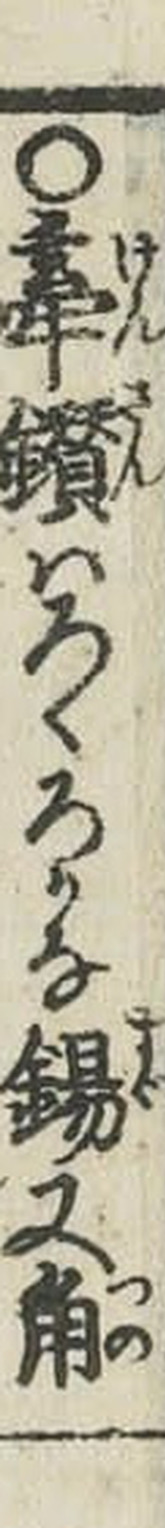○牽鑚はろくろかな錫又角
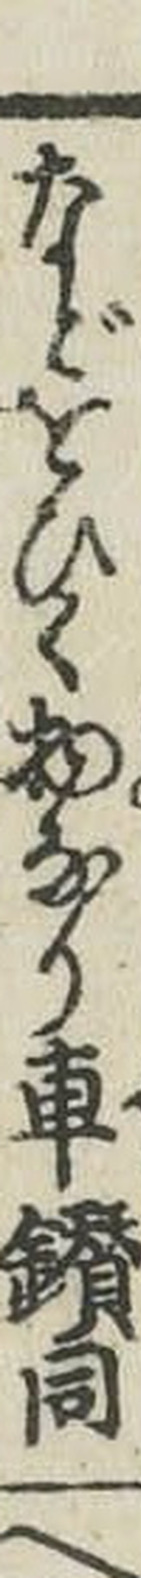などをひく物なり車鑚同
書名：増補頭書訓蒙図彙大成 10巻 5:巻之9-11
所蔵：東京学芸大学教育コンテンツアーカイブ
